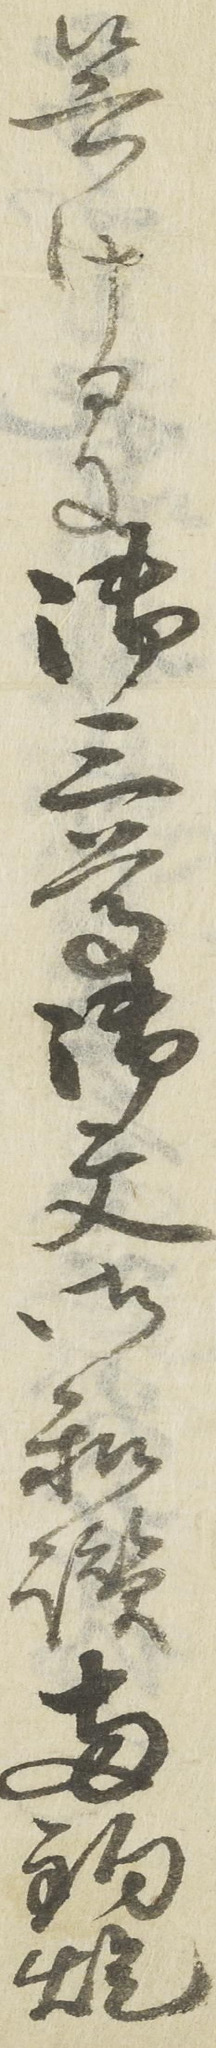呉けるに御三尊御文御和讃両鉤砲
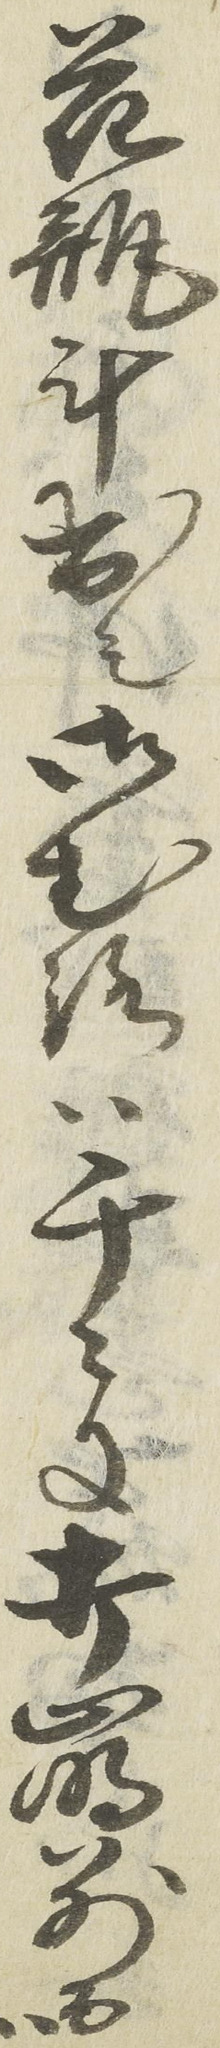花瓶計出シ御花洛は千〻に打崩前而は
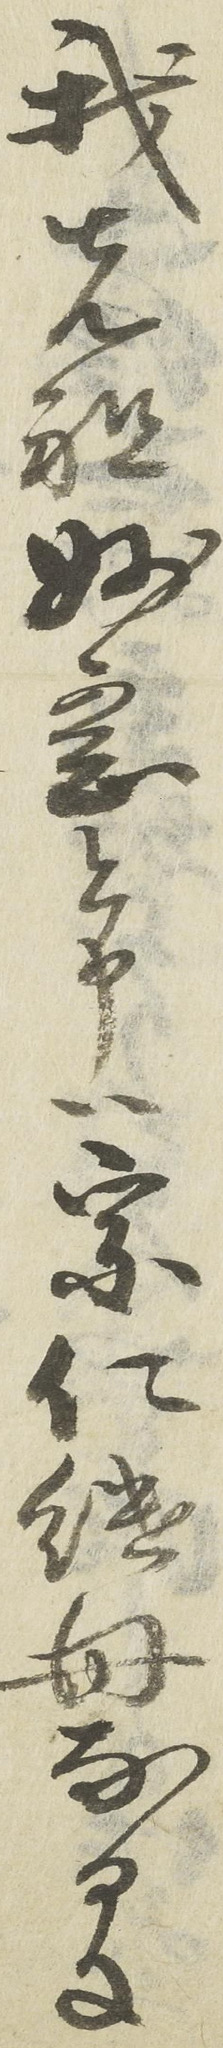我先祖妙意と申は宗仁継母なるに
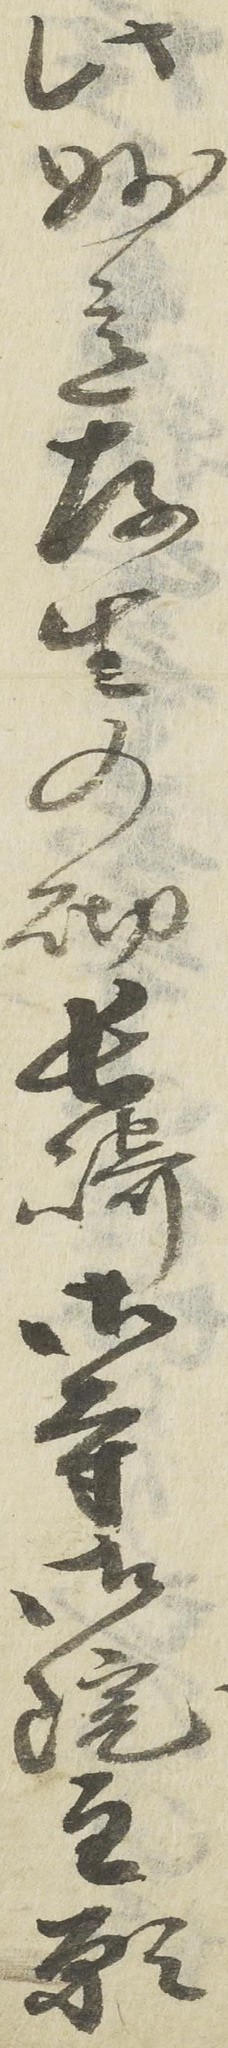此妙意存生の砌長﨑御寺御院主願
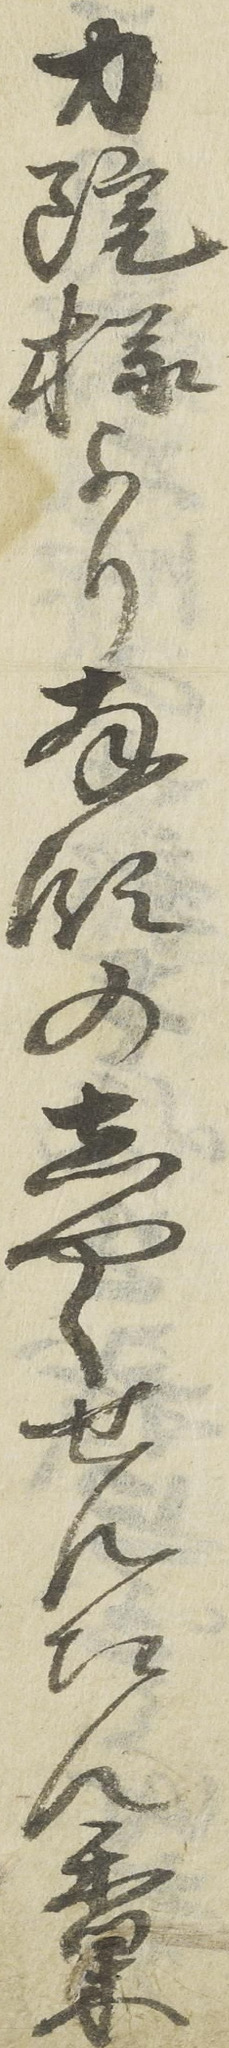力院様より拝領のしやくせんたん香木
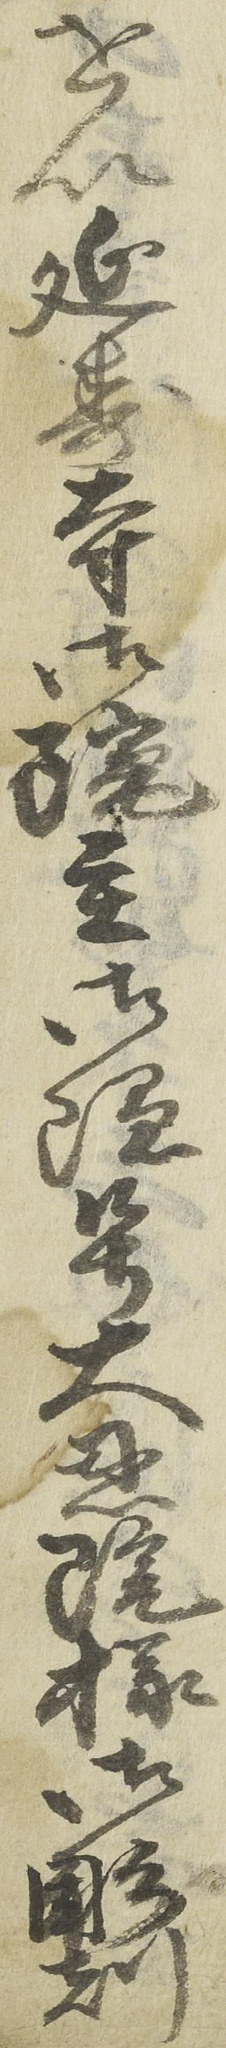を以延寿寺御院主御隠号大忍院様御彫刻

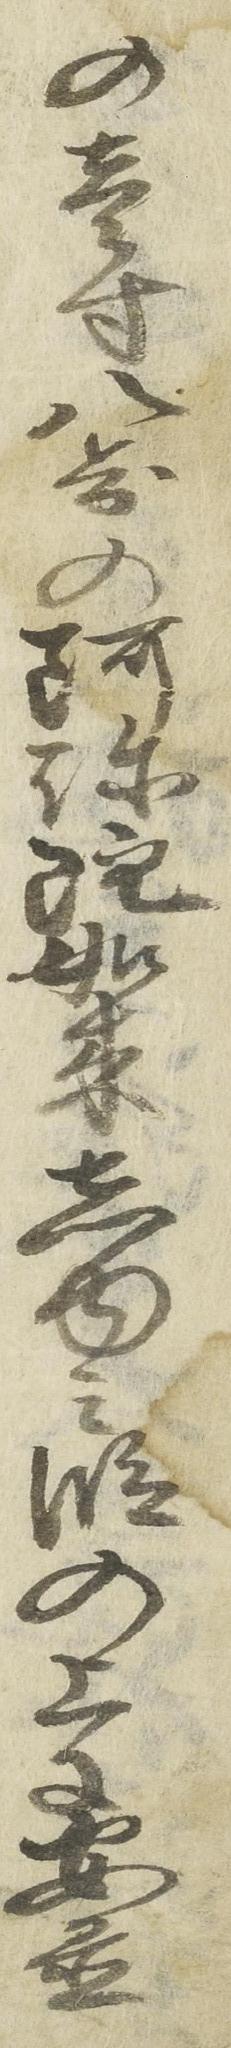の壱寸八歩の阿弥陀如来しゆ之段の上に安置
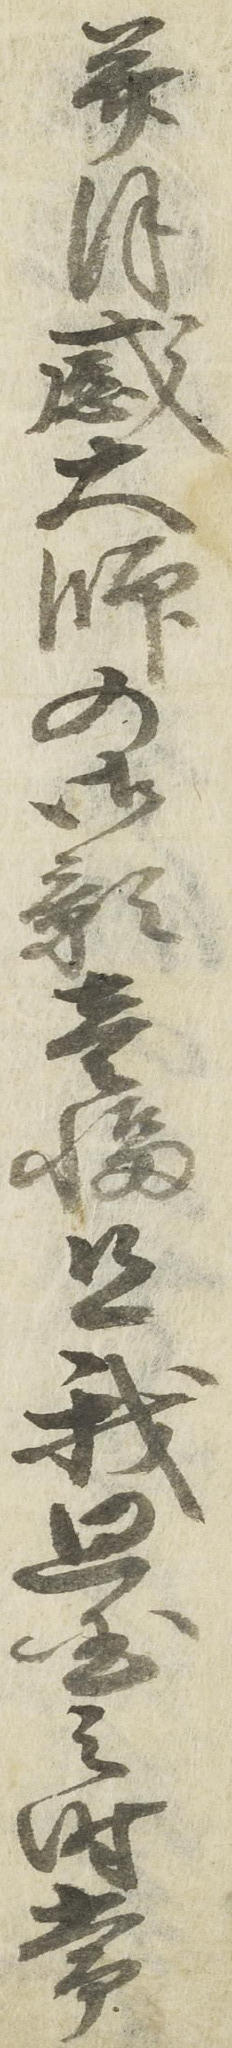幷月感大師の御影壱幅且我廻国之時常
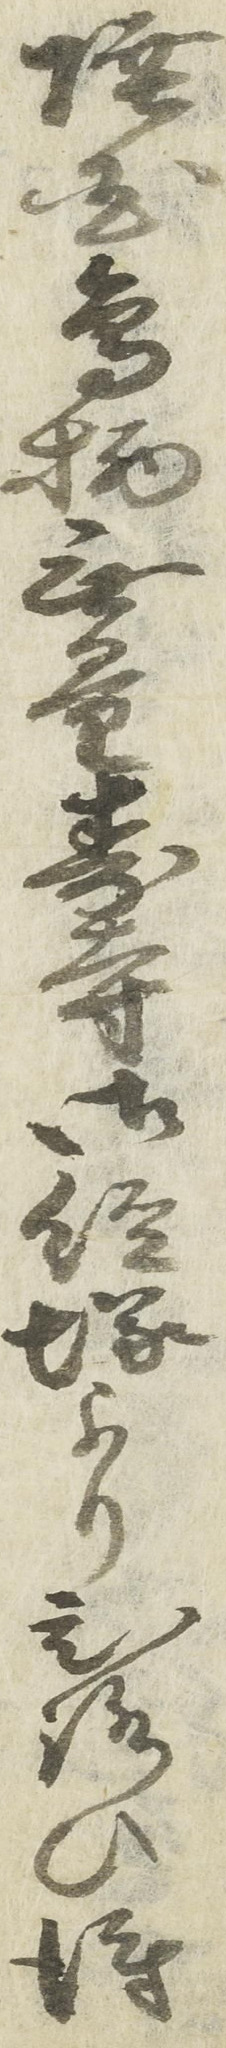陸国鳥栖無量寿寺御経塚よりひろひ得
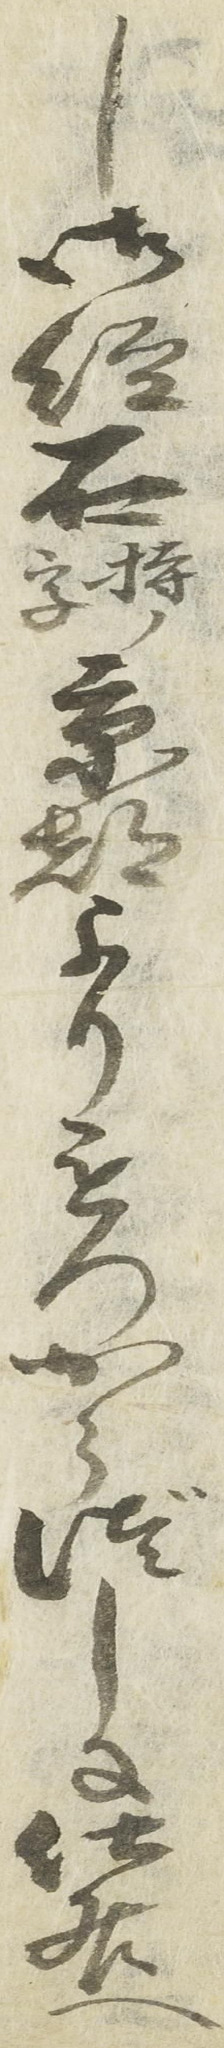し御経石持ノ字京都より遠つからづしに仕居へ
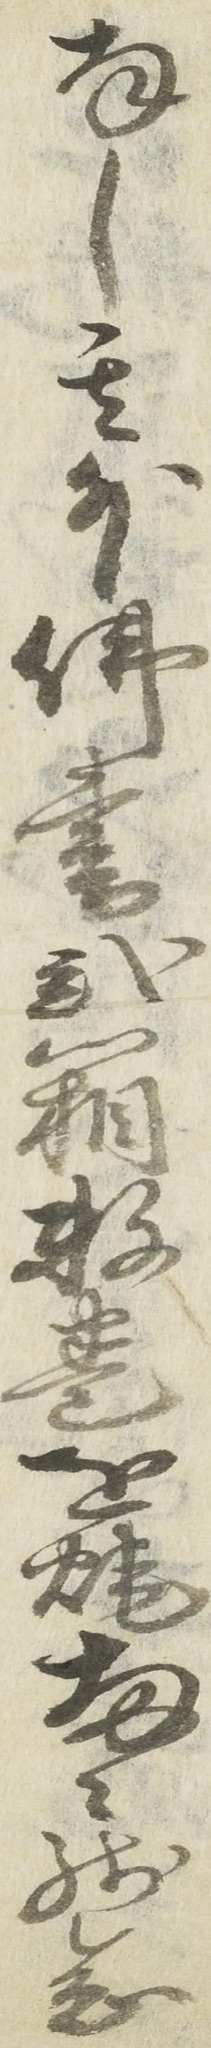拝し其外佛書弐箱数巻を焼扨残念
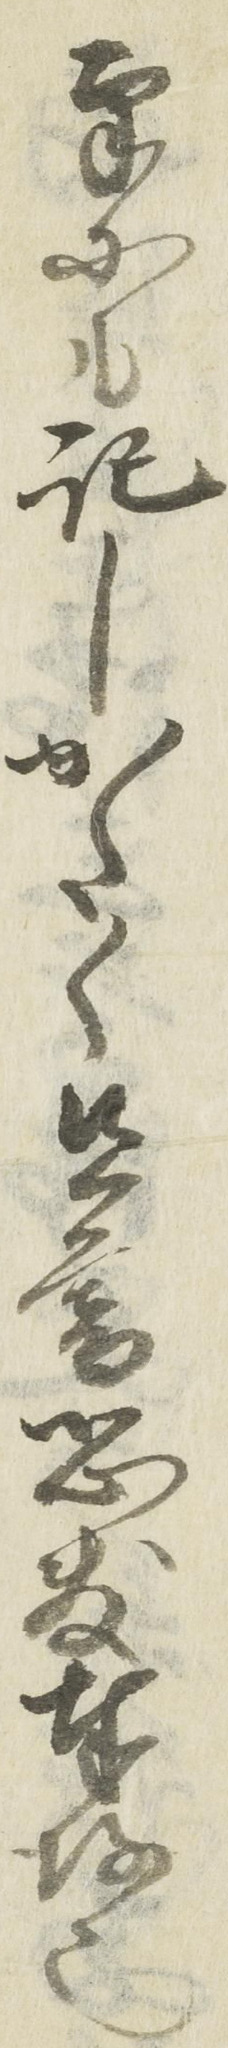筆にも記しかたく且暮恐敷奉存也
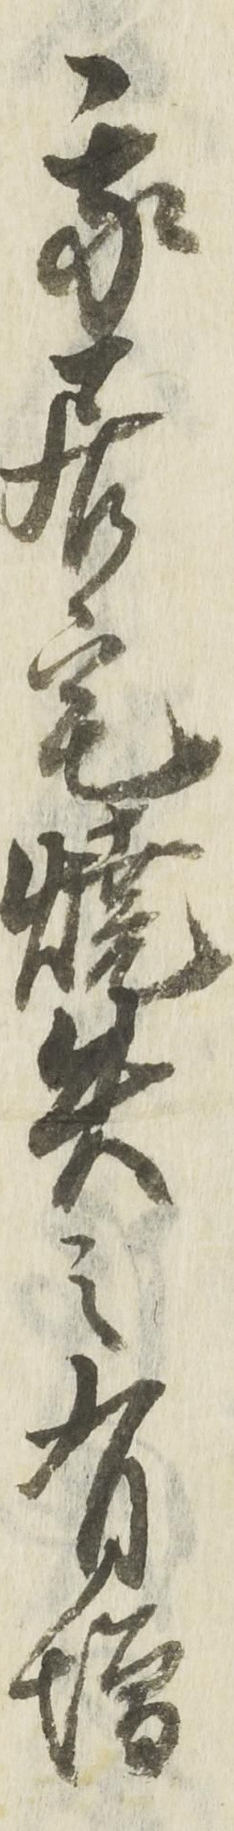我居宅焼失之有増
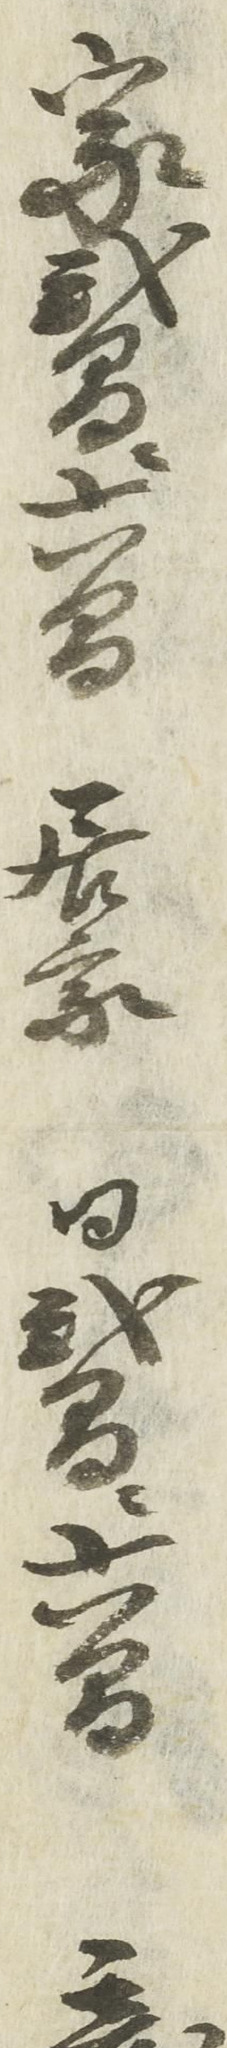家弐間ニ六間居家同弐間ニ六間台所
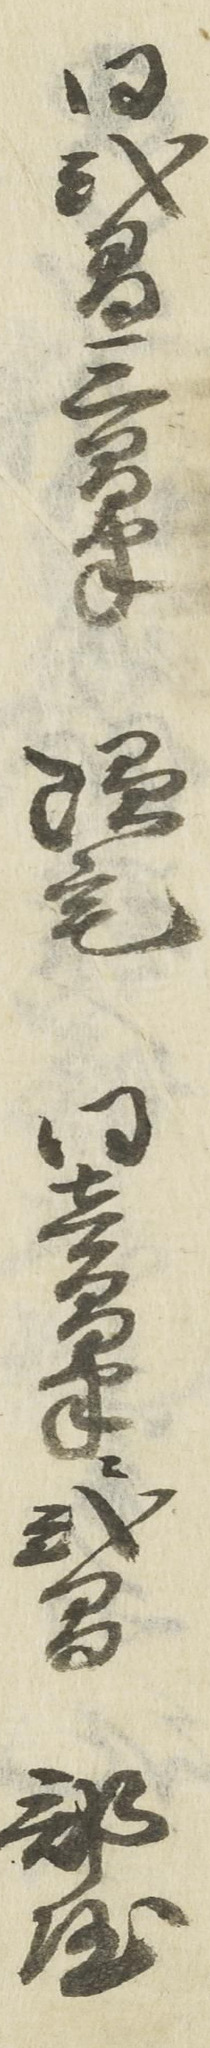同弐間三間半隠宅同壱間半ニ弐間部屋
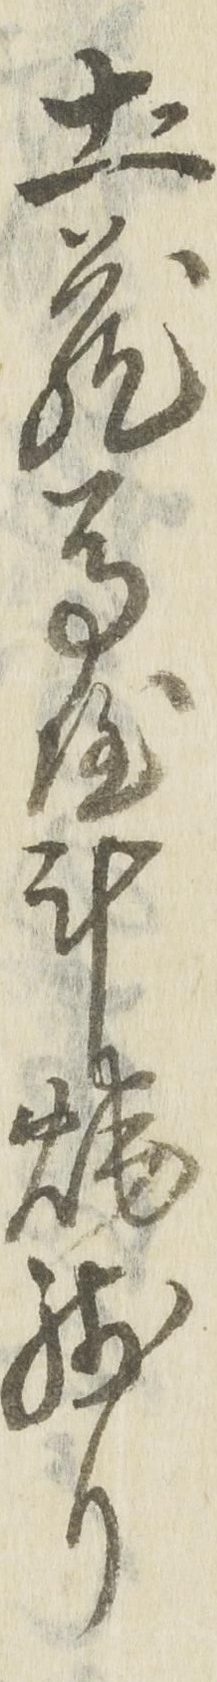土蔵馬屋計焼残り
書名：後見笑
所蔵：東京大学地震研究所図書室 Earthquake Research Institute Library, The University of Tokyo, JAPAN
